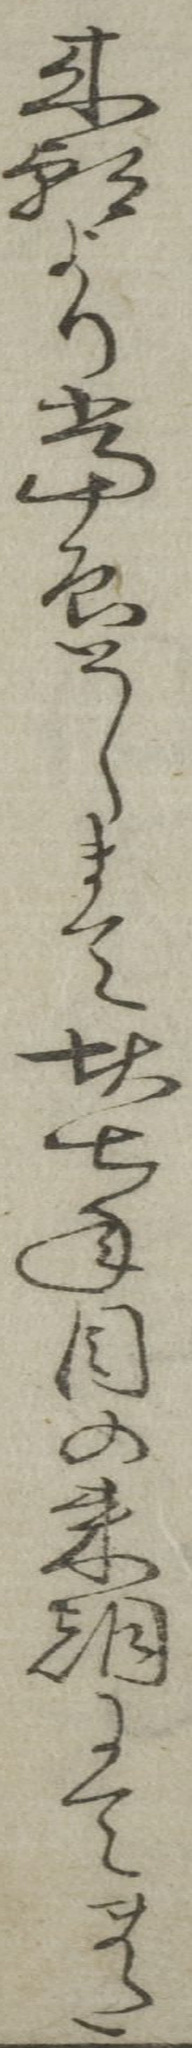来朝より当辰としまて廿七年目の来朝にてまた
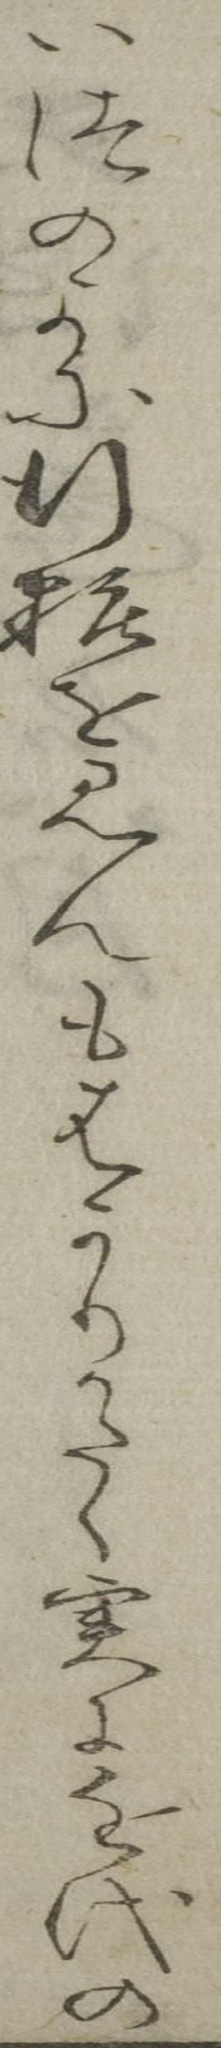いつのよに行粧を見んもはかりかたく実に近代の
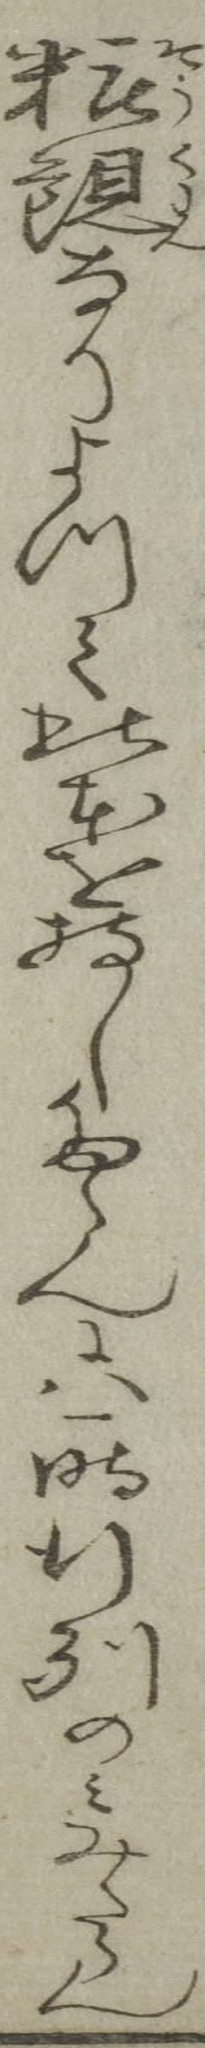粧観なりよつて此本を持したらんには一時行列のみみたらん
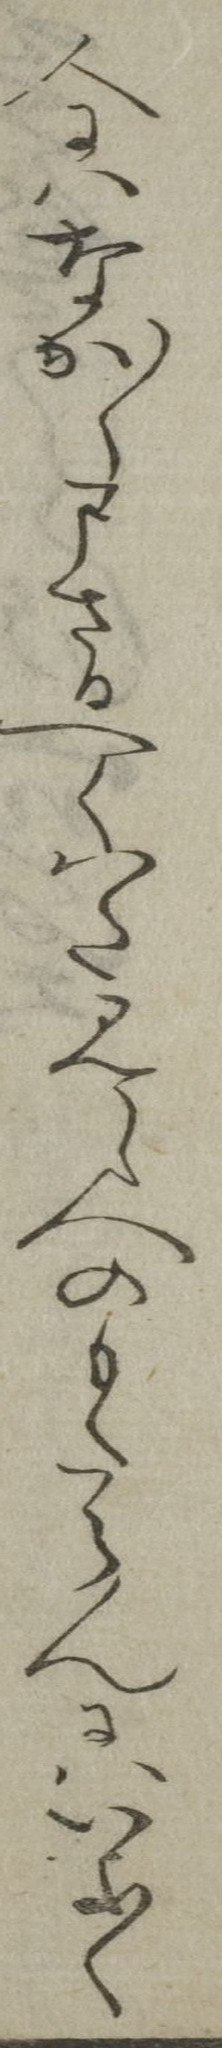人にはなか〳〵まさるへくはた見し人のもたらんにはいよ〳〵
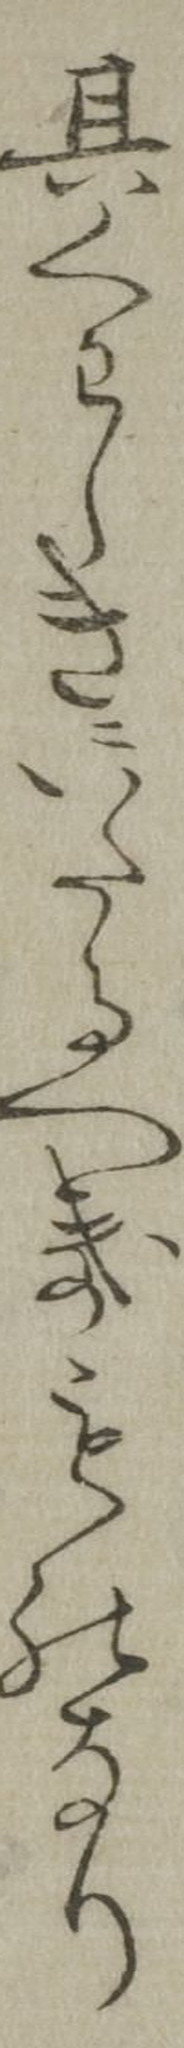其くわしきにいたるへきものなり
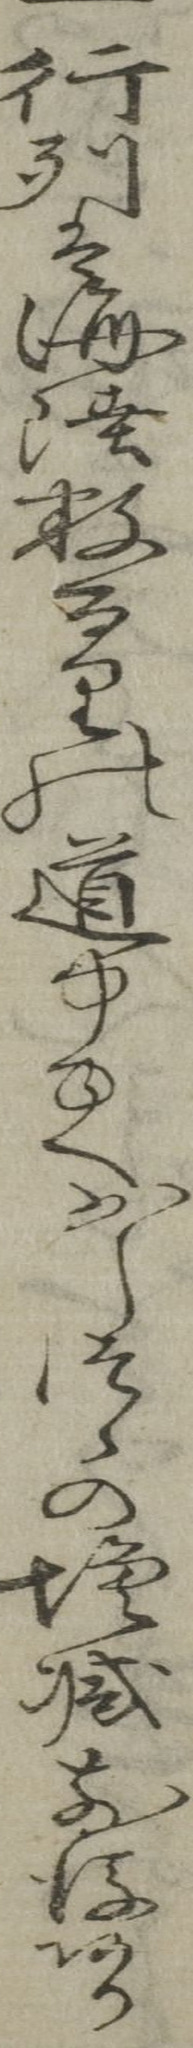一行列は海陸数百里の道中ゆへ少しつゝの増減前後あり
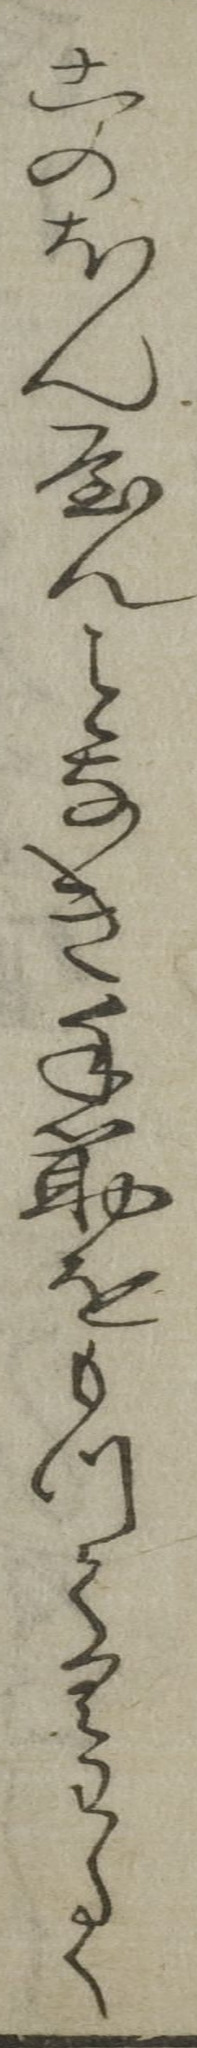このほんやんことなき手筋をもつてくわしく
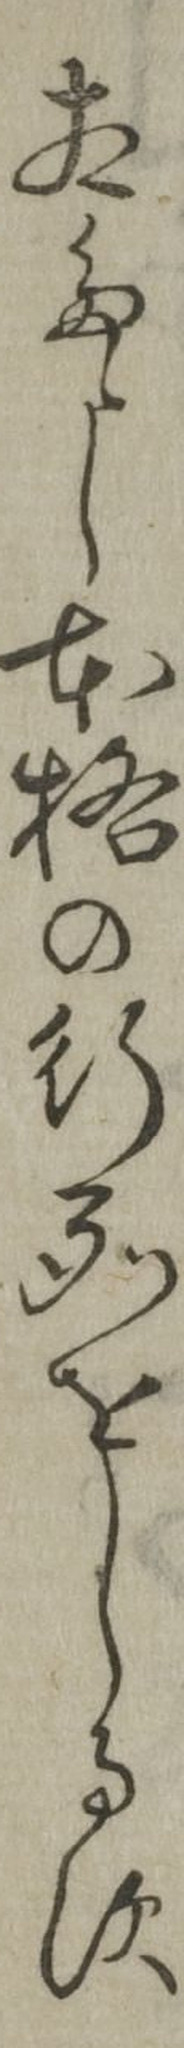相たゝし本格の行列をしるす
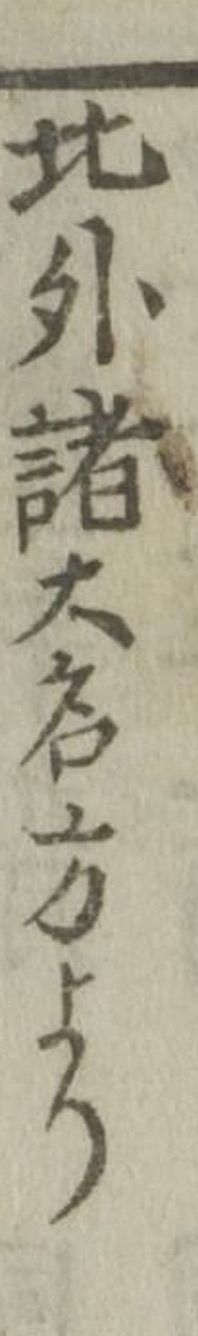此他諸大名方より
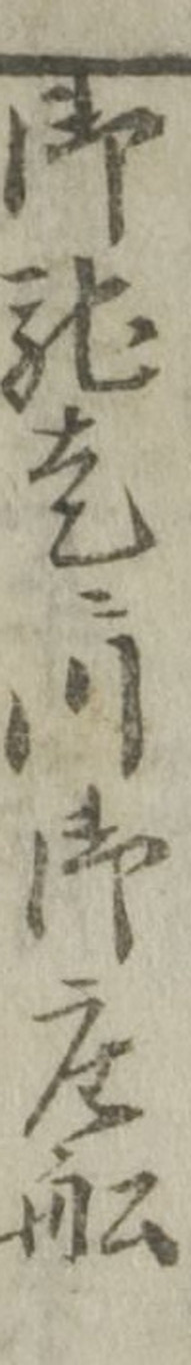御馳走に川御座船
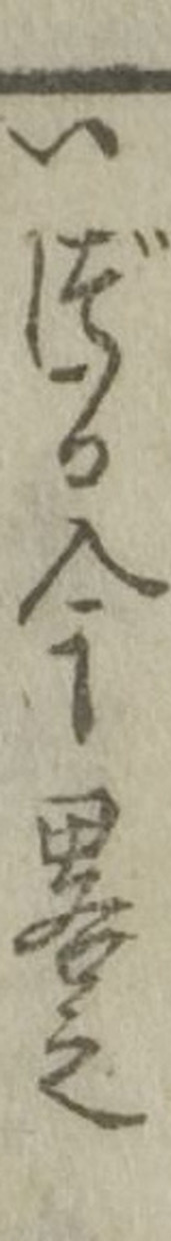いづる今略之

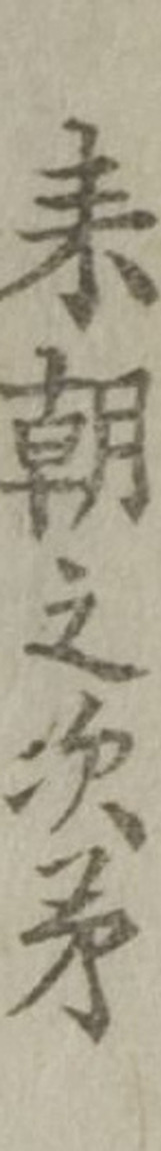来朝之次第
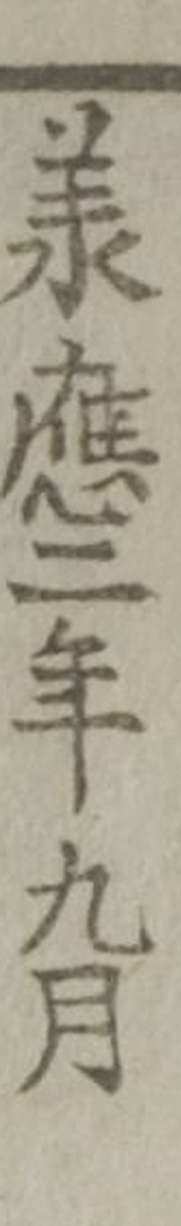承應二年九月同
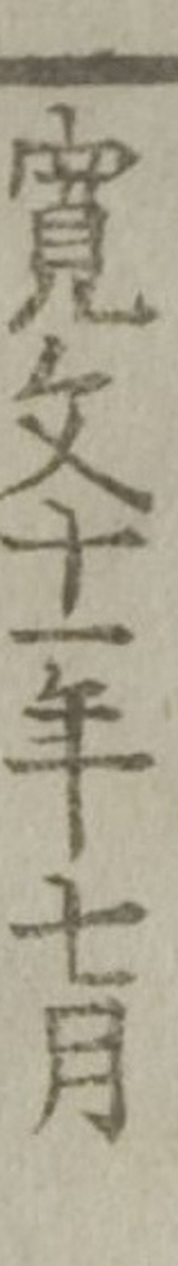寛文十一年七月同
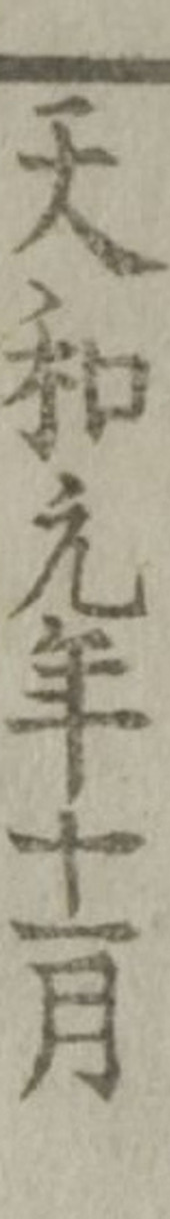天和元年十一月同
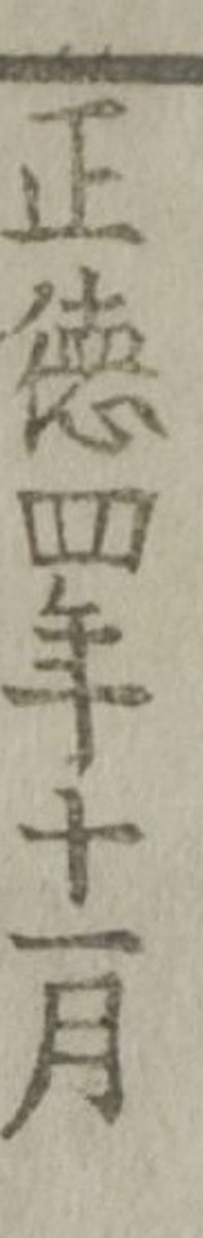正徳四年十一月同
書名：琉球人行列記 天保3年
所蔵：University of the Ryukyus Library
